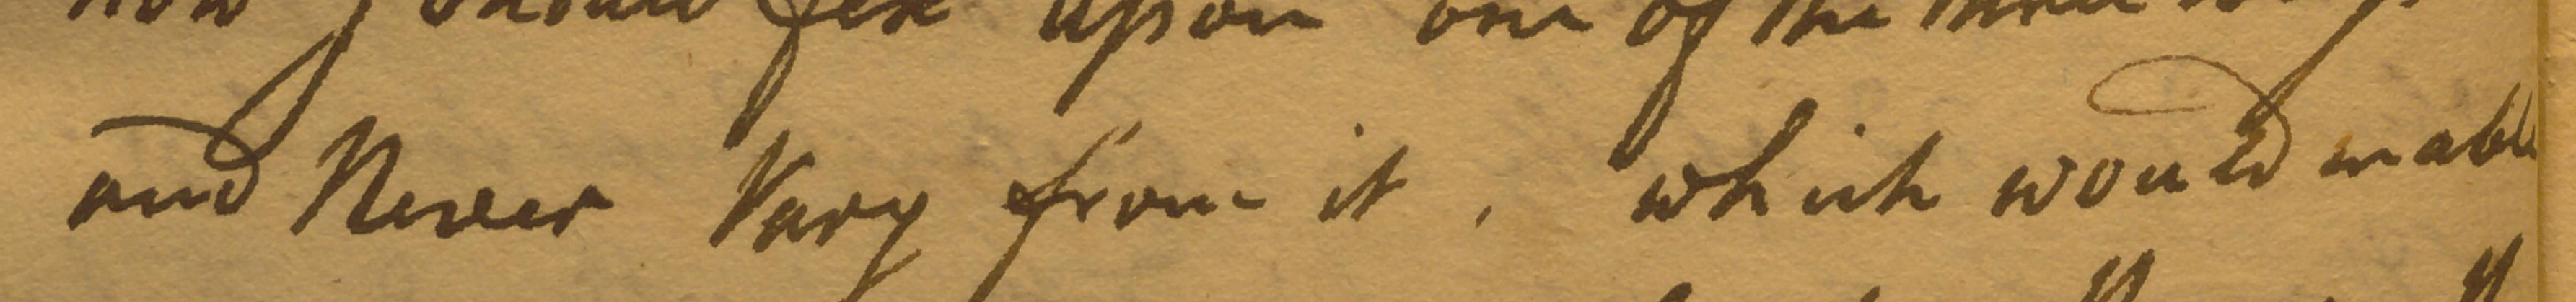and Never Vary from it. which would mabe
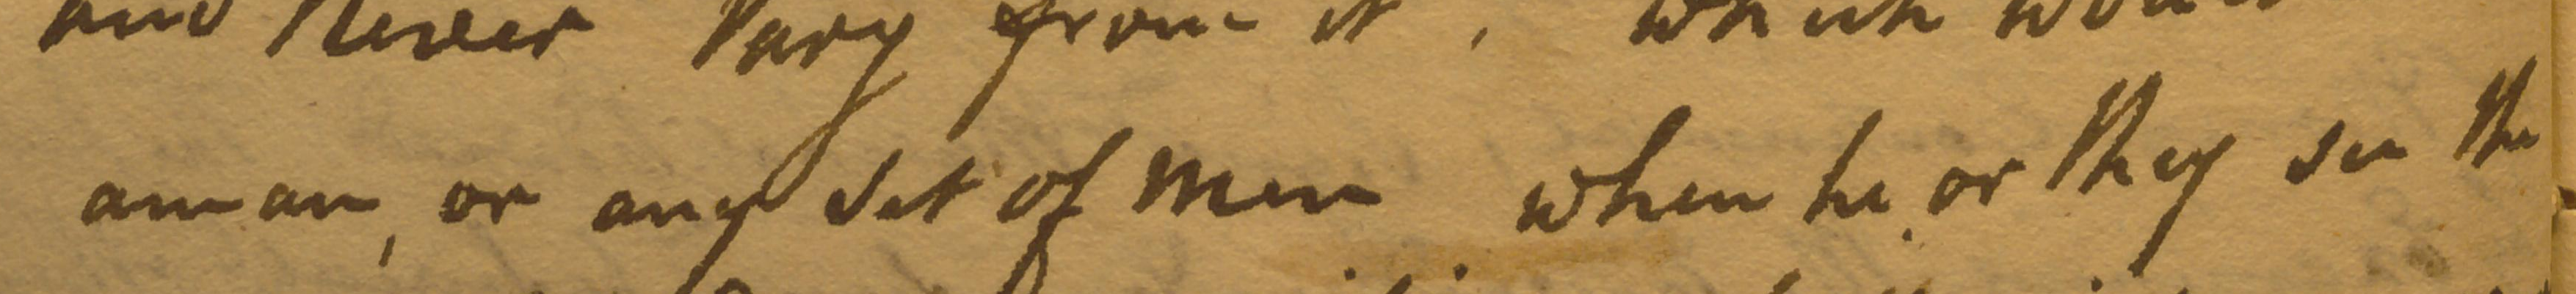am an or any set of men when he or they see the
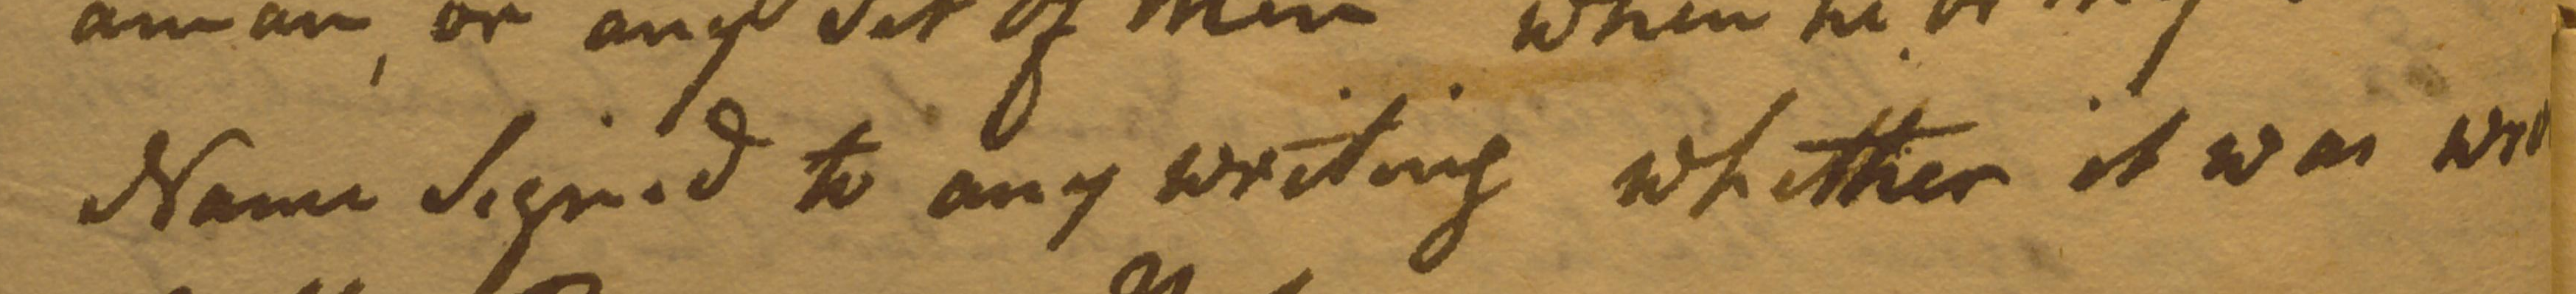Name signed to any writing whether it was with
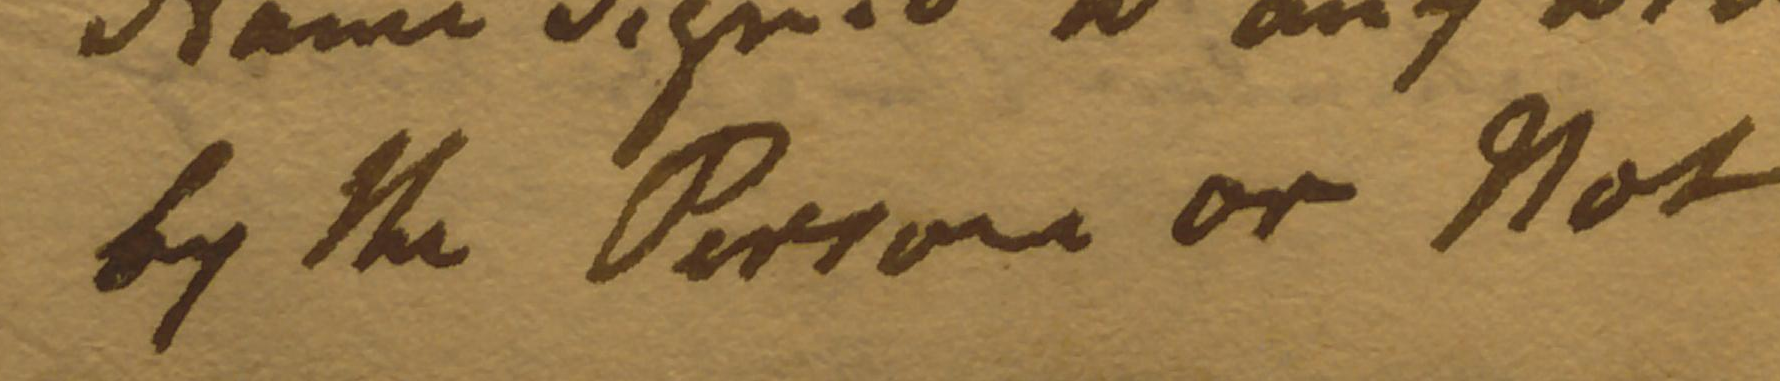by the Person or Not
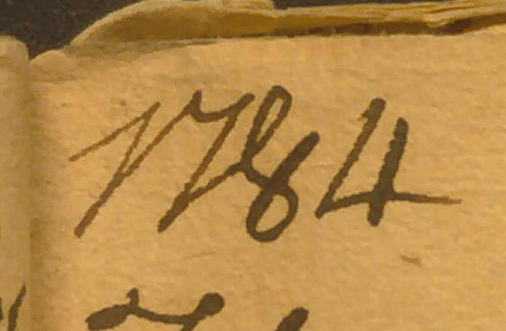1784
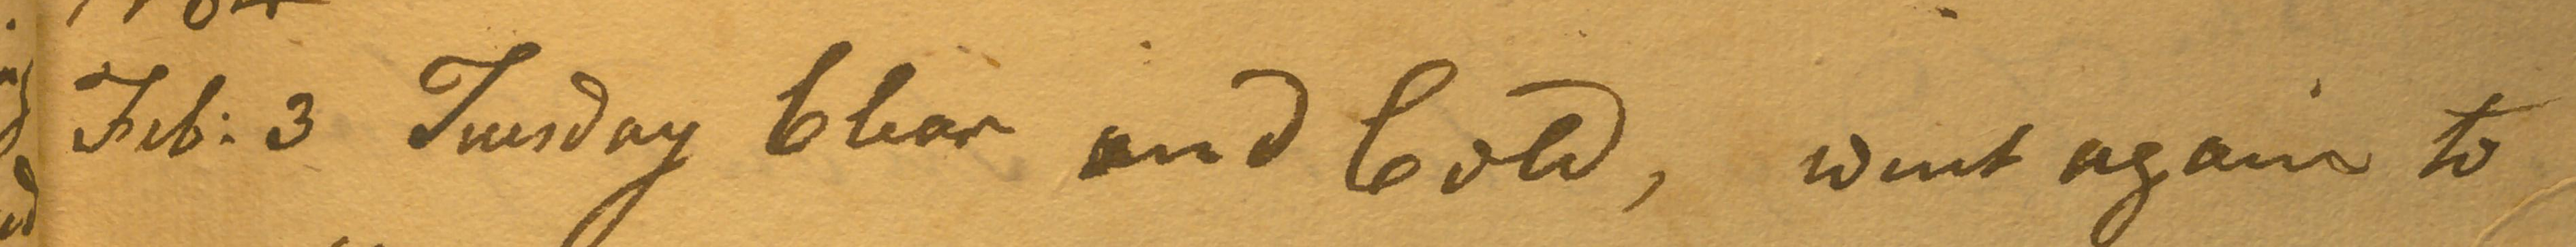Feb: 3 Tuesday Clear and Cold, went again to
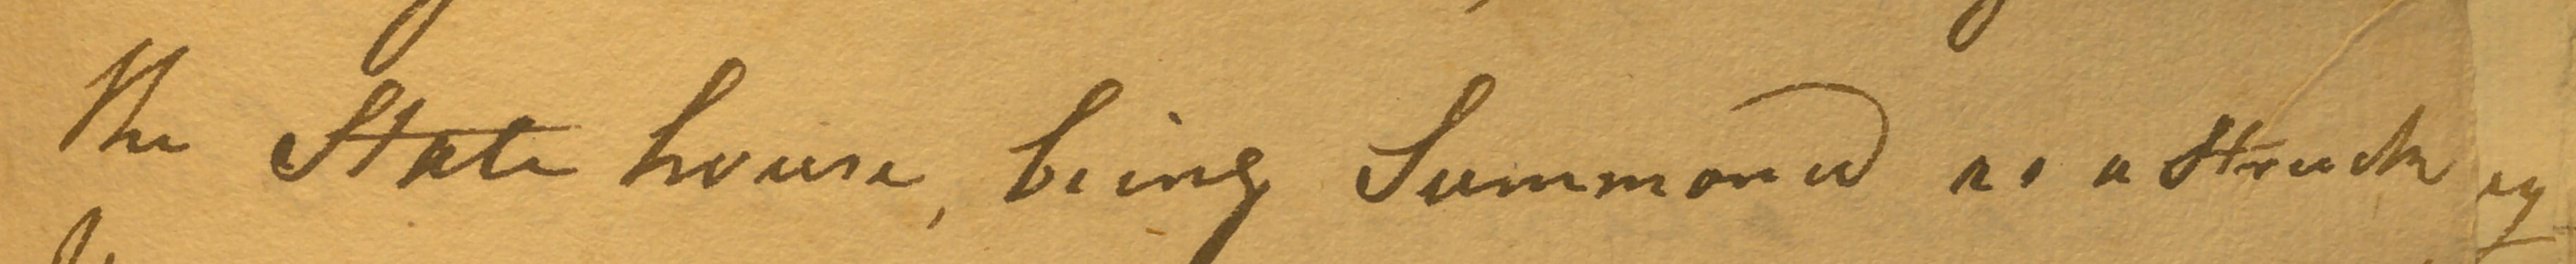the State house being Summoned as a Struck
